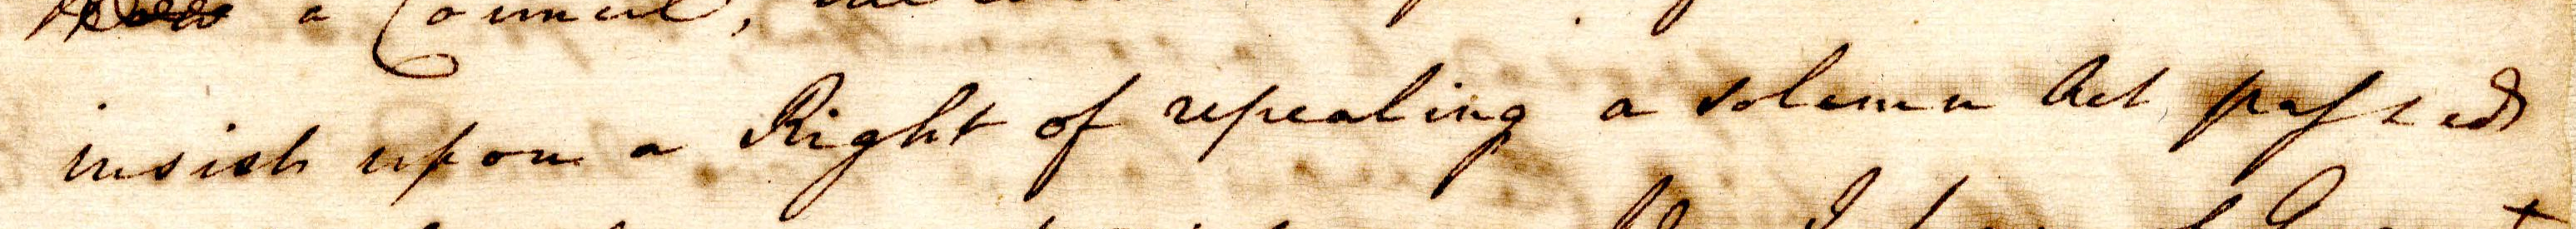insist upon a Right of repealing a solemn Act passed
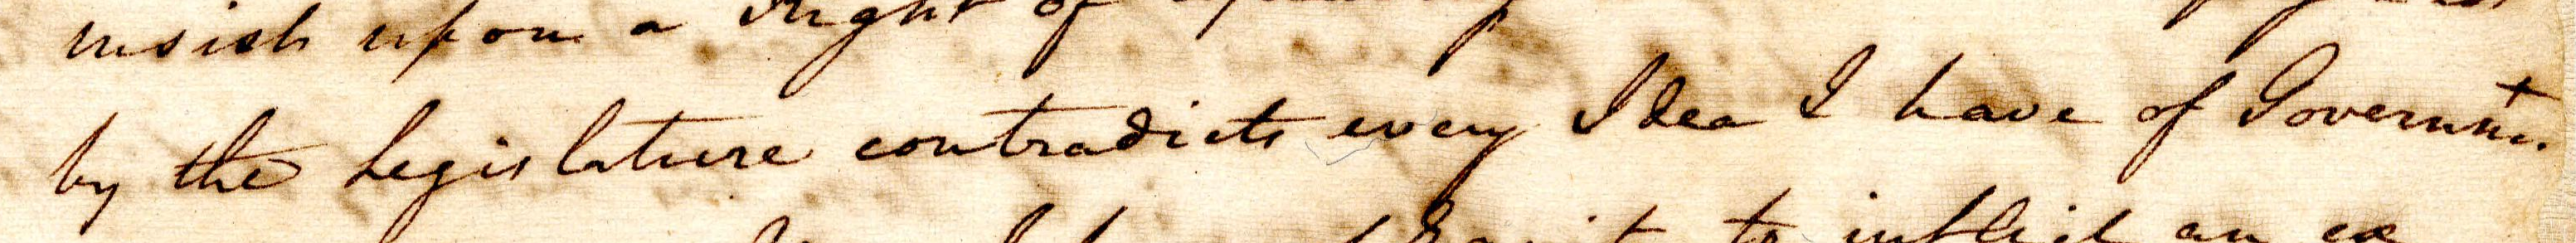by the Legislature contradicts every Idea I have of Govern^t.
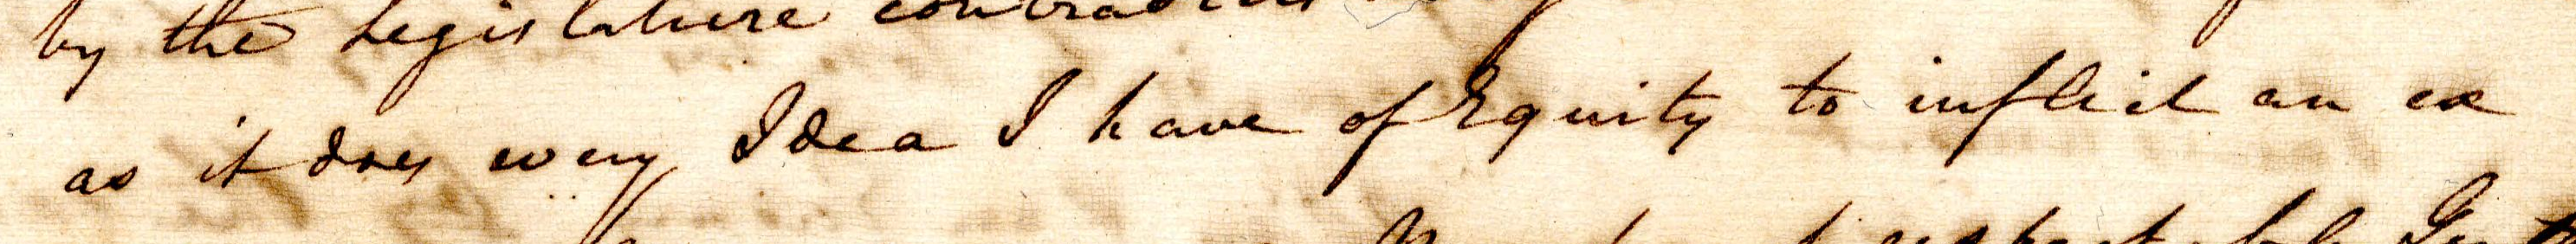as it does every Idea I have of Equity to inflict an ex
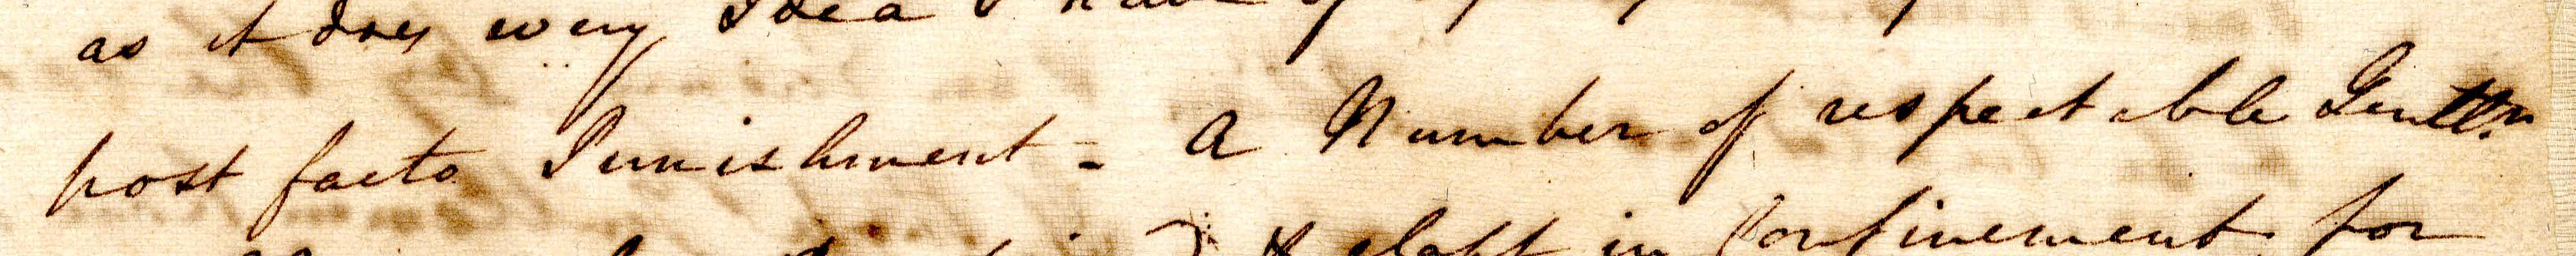post facto Punishment. A Number of respectable Gentl^n.
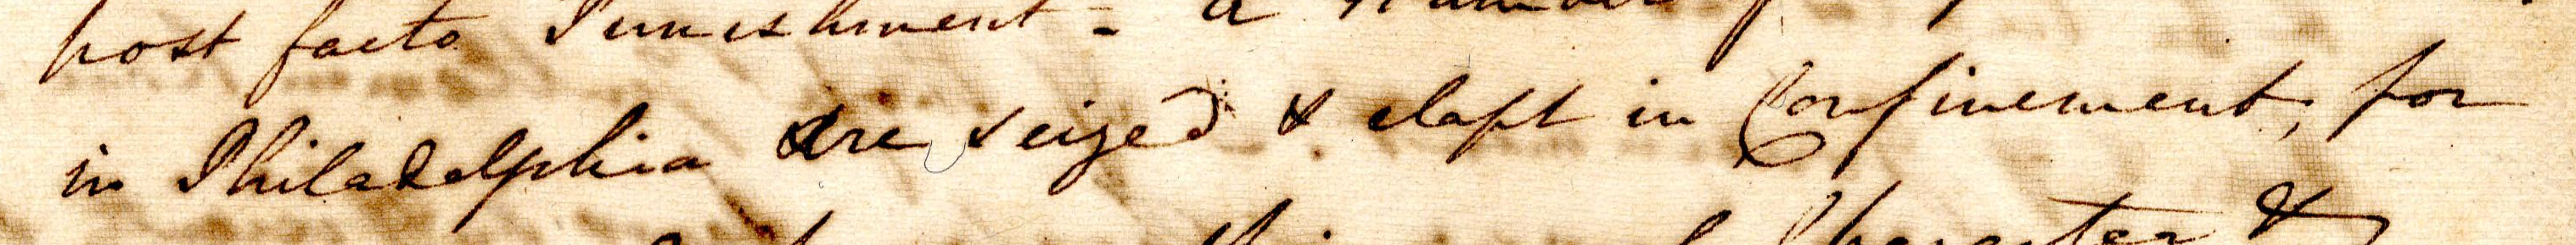in Philadelphia are seized & clapt in Confinement, for
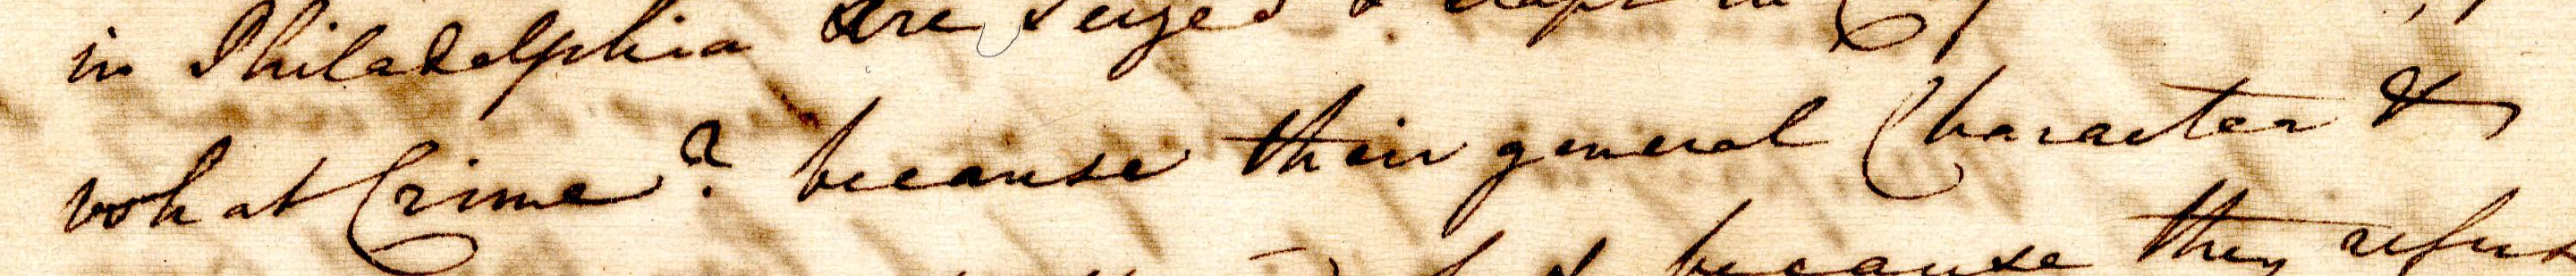what Crime? because their general Character &
